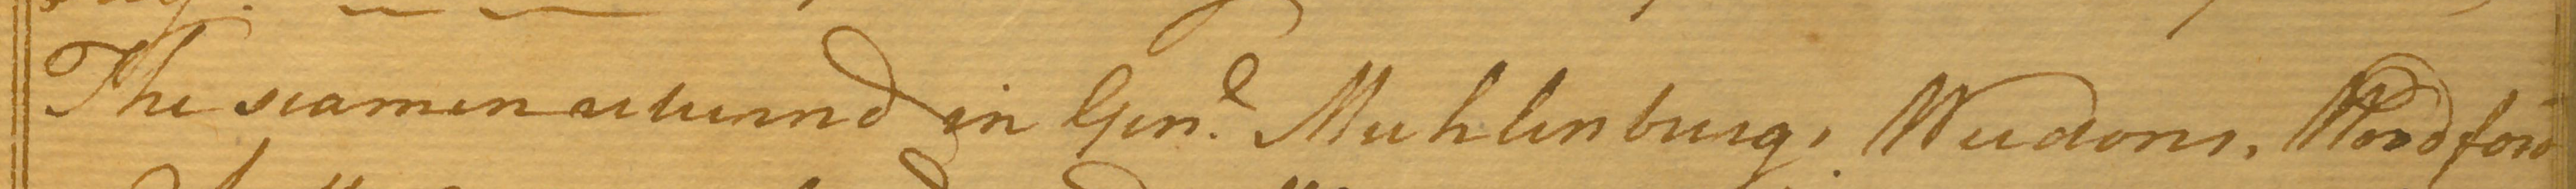The seamen returnd in Gen^l. Muhlenburgs, Weedons, Woodford
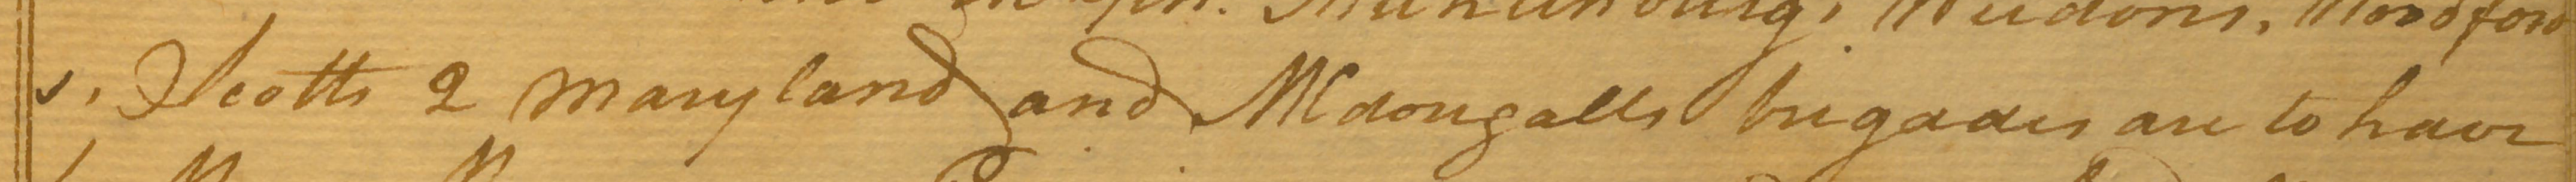s, Scotts 2 Maryland and MCdougalls brigades are to have
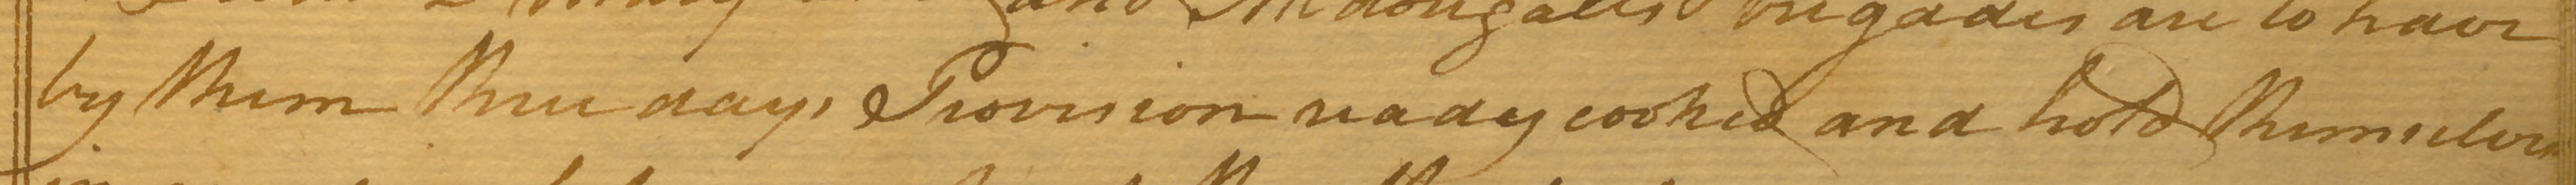by them three days Provisions ready cooked and hold themselves
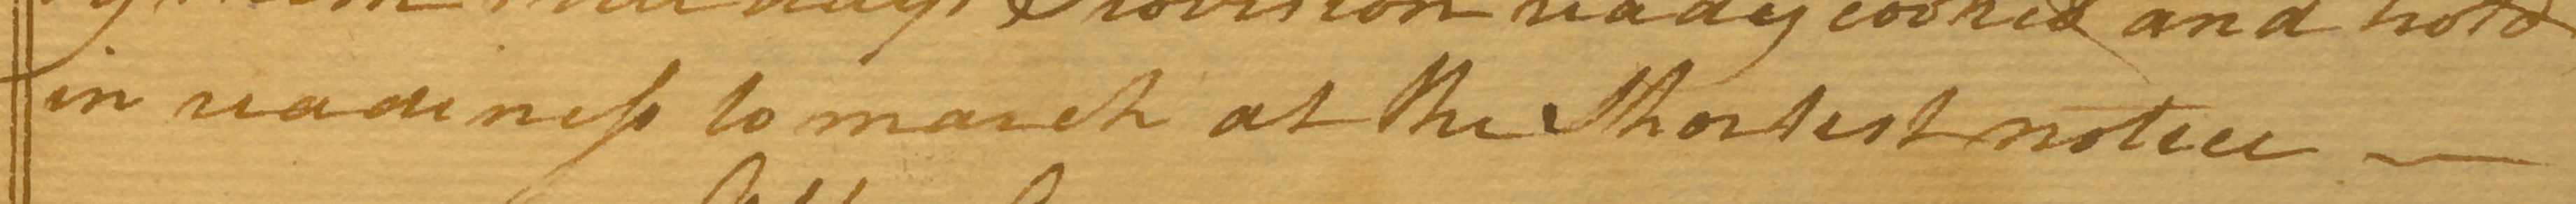in readiness to march at the shortest notice-
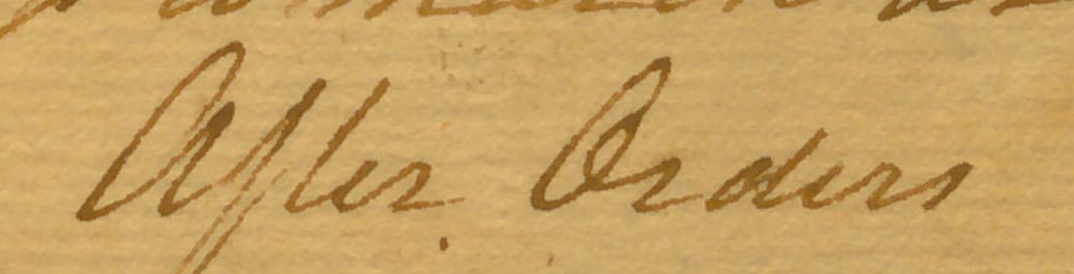After Orders
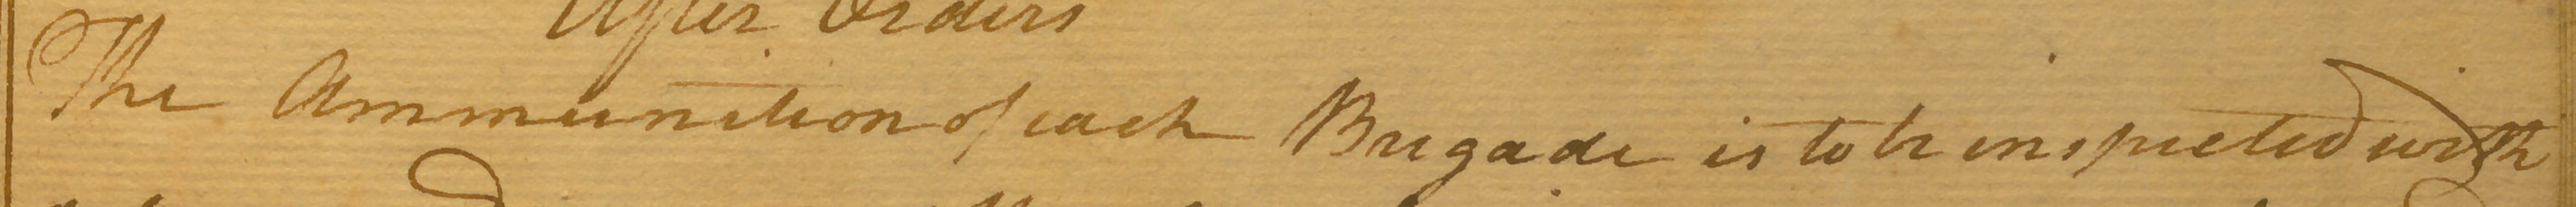The Ammunition of each Brigade is to be inspected with
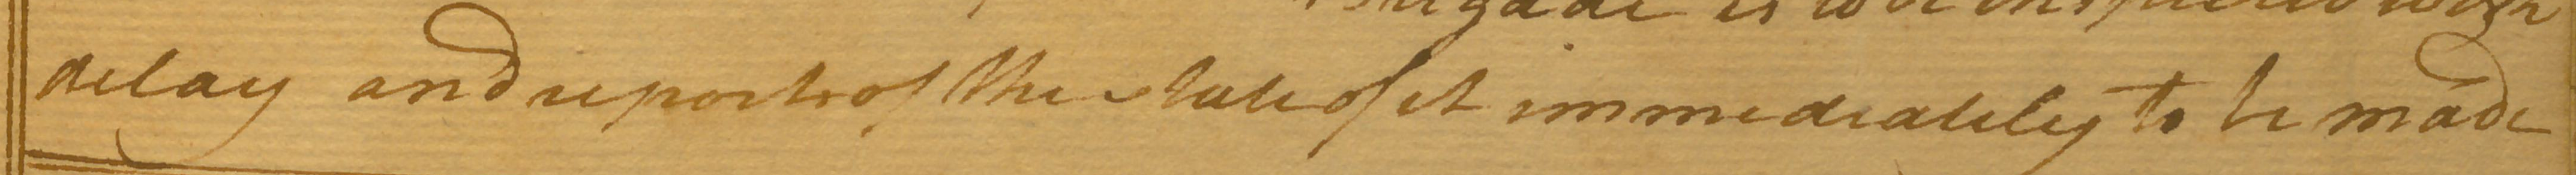delay and reports of the state of it immediately to be made
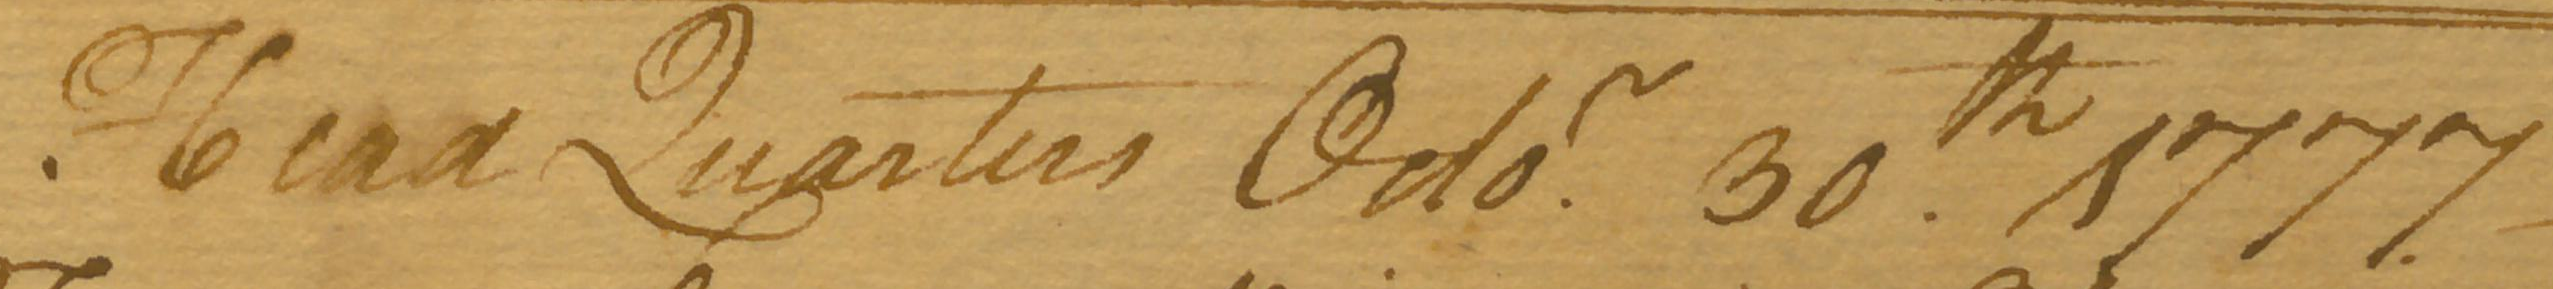Head Quarters Octo^r. 30^th. 1777.
